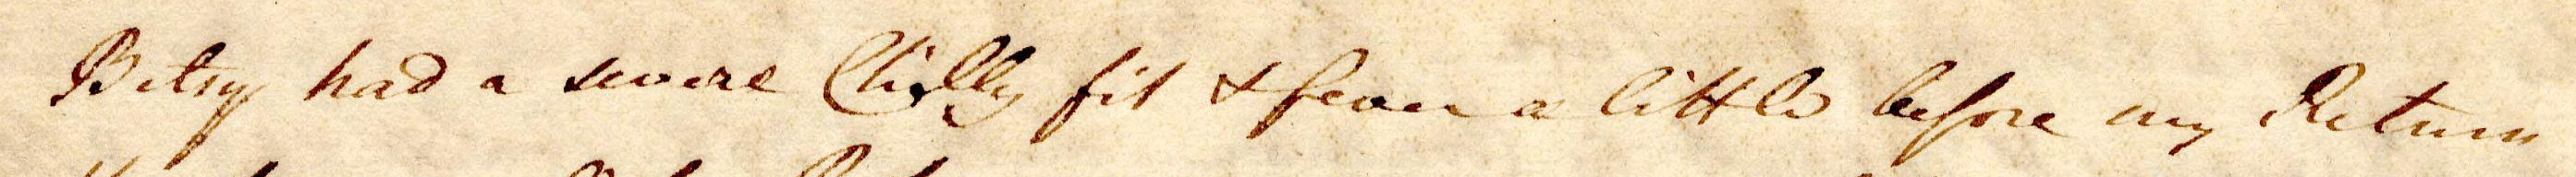Betsy had a severe Chilly fit & fever a little before any Return
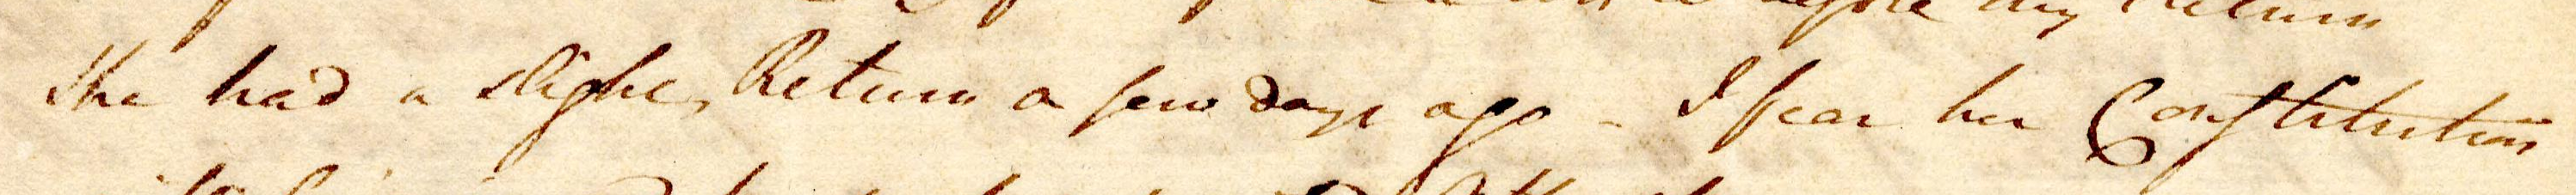she had a slight, Return a few days ago. I fear her Constitutions
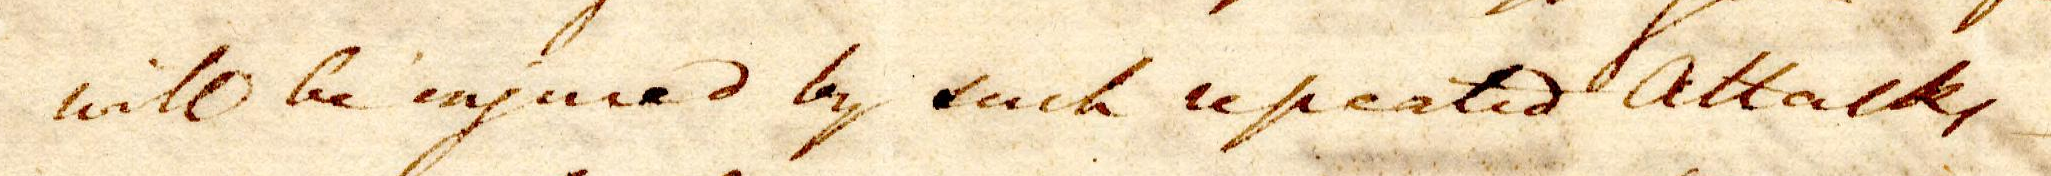will be injured by such repeated Attacks
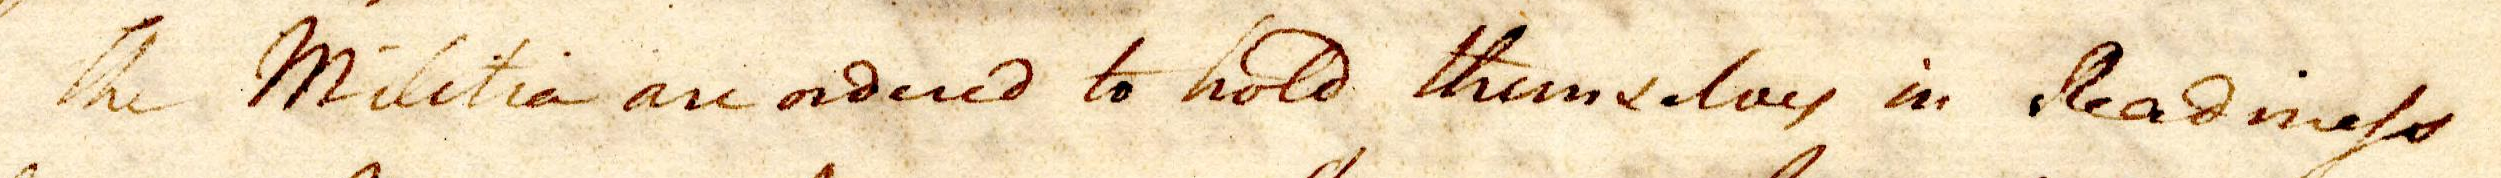the Militia are ordered to hold themselves in Readiness
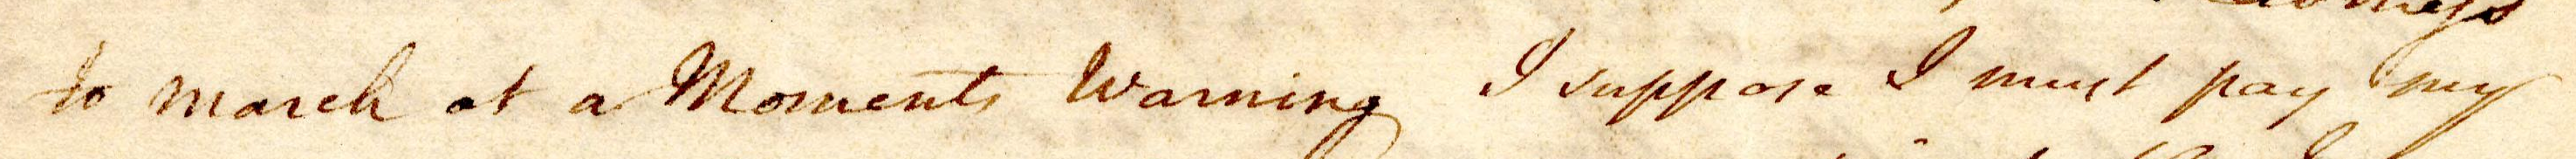to march at a Moments Warning, I suppose I must pay my
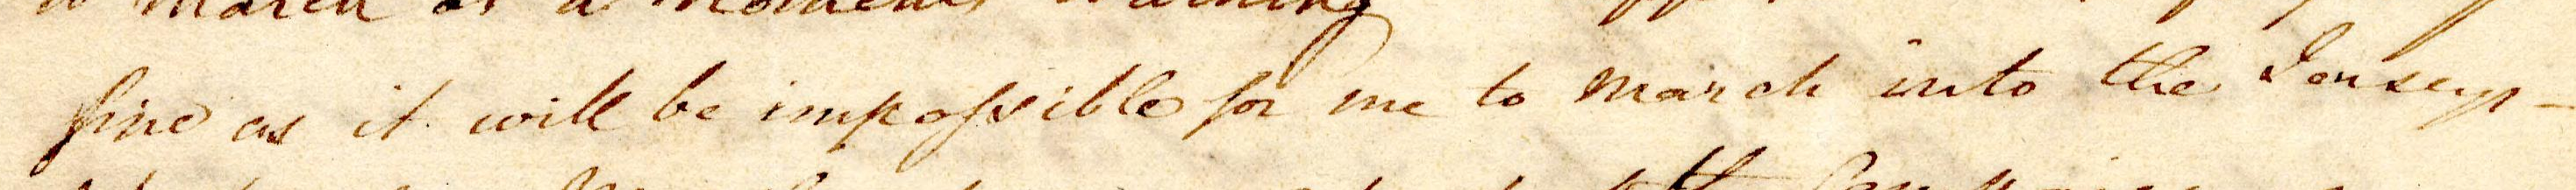fine as it will be impossible for me to march into the Jerseys
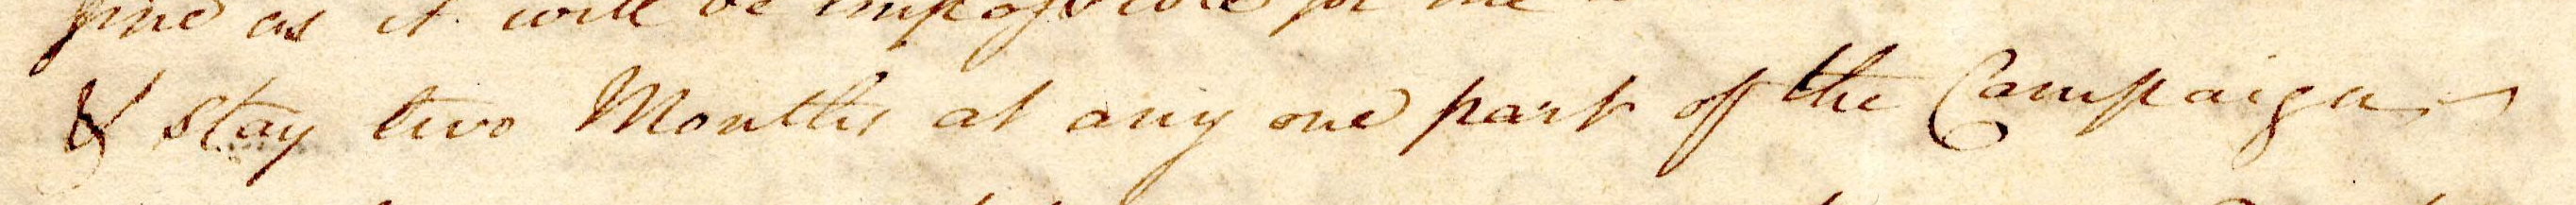& stay two Months at any one part of the Campaign.
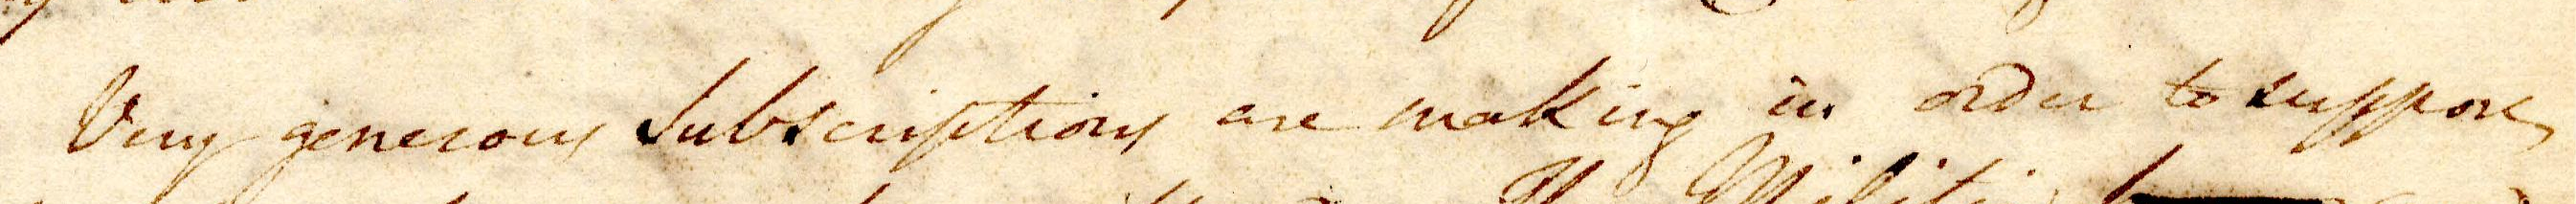Very generous Subscriptions are making in order to suppose
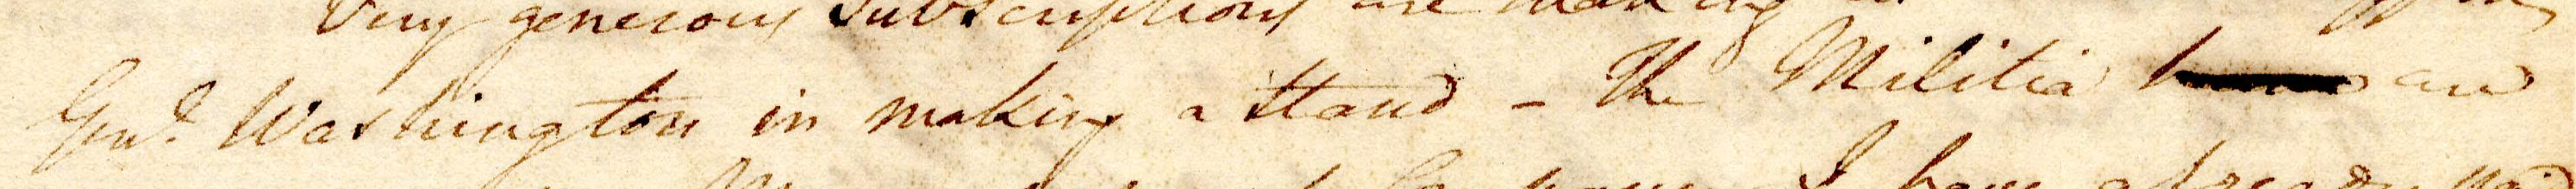Gen^l. Washingtors in making a Stand. The Militia here are
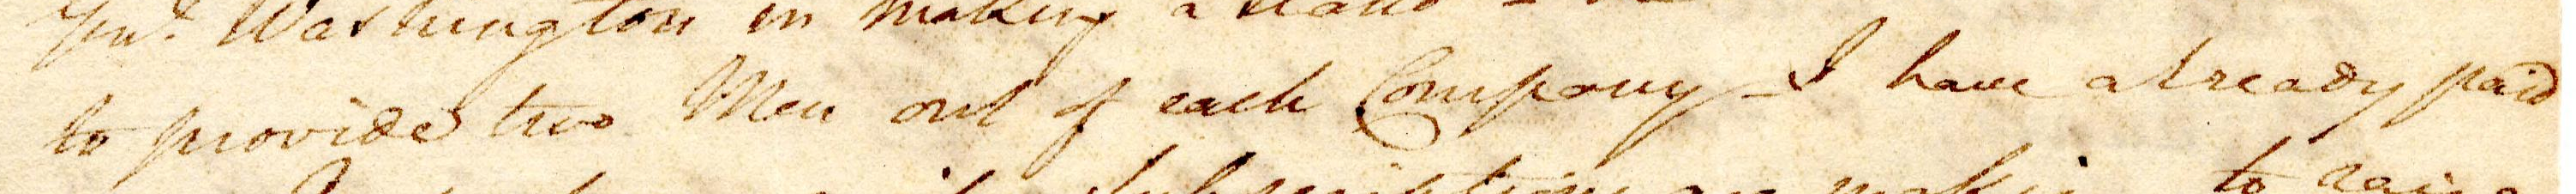to provide two Men out of each Company. I have already paid
